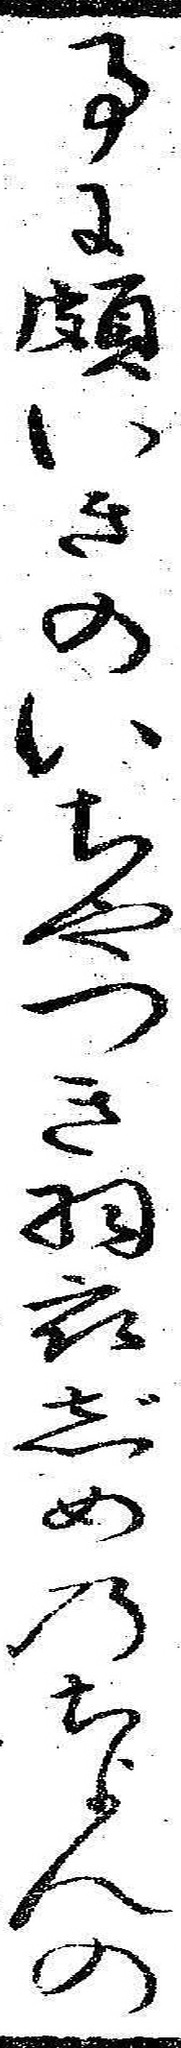事に頗いきのいちやつき羽衣じめのちよんの
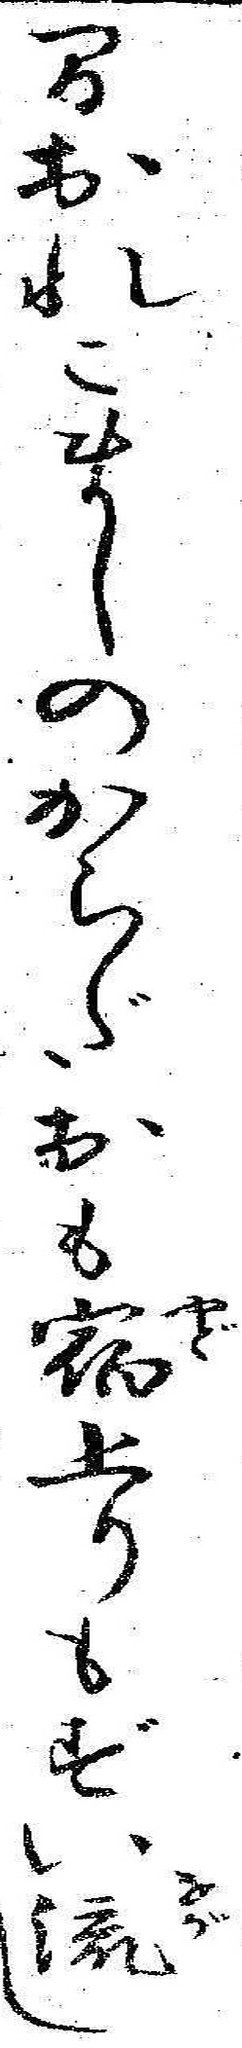間おれこましのからだおも宿上りもずい流し
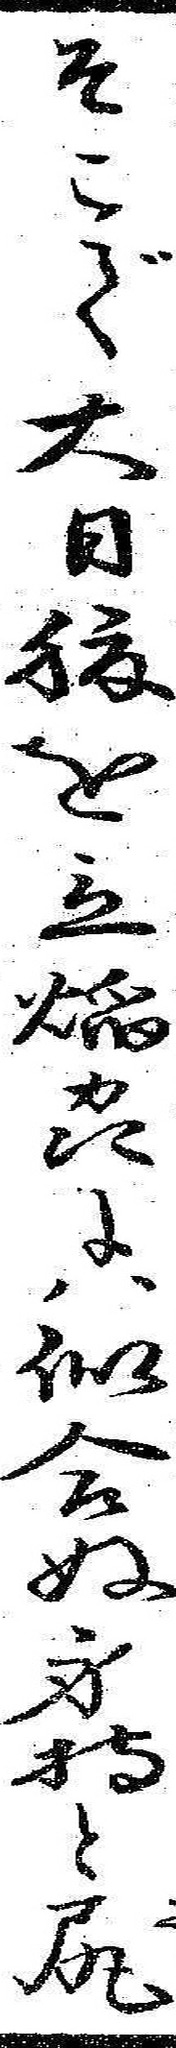そこで大日腹を立焔州には似合ぬ身持と尻
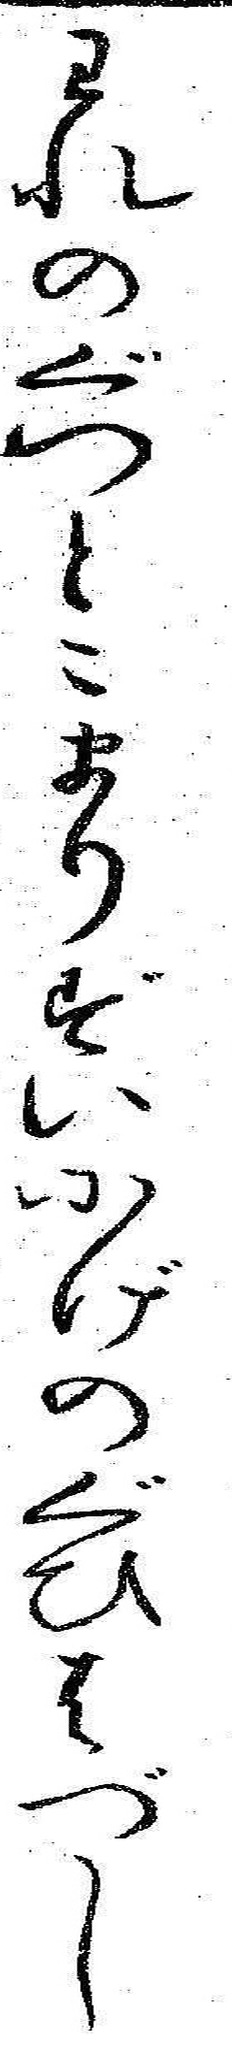われのぐつとこまりずいにげのぐひはづし
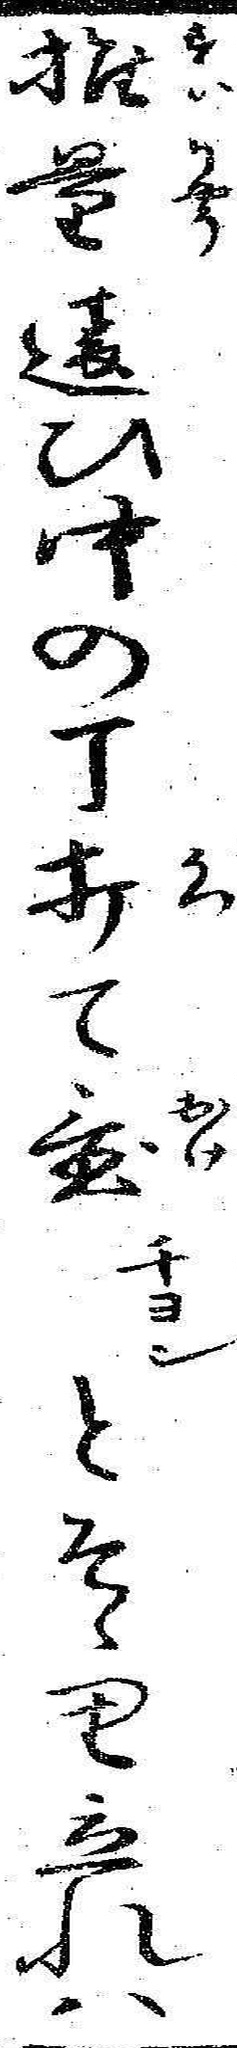推量違ひ中の丁打て置ゝり立れは
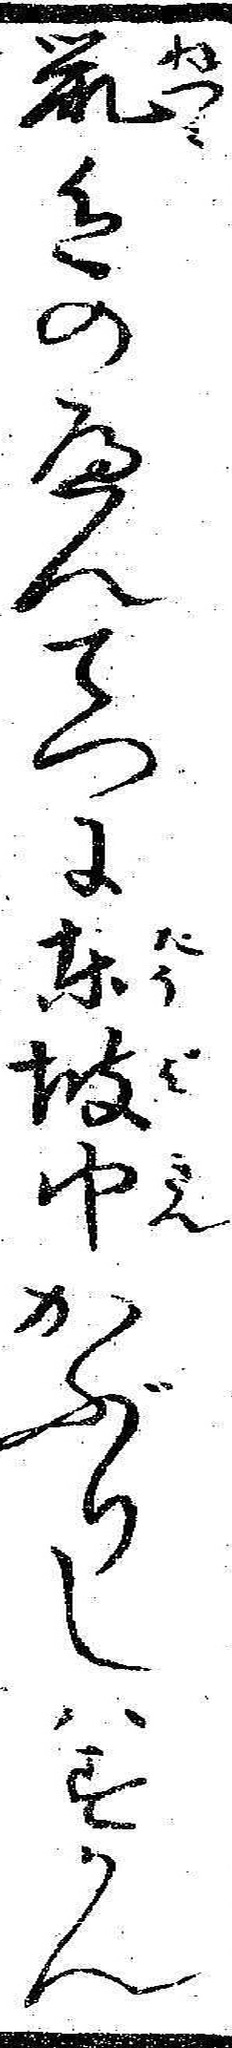鼠色のへんてつに東坡巾かぶりしはすかん
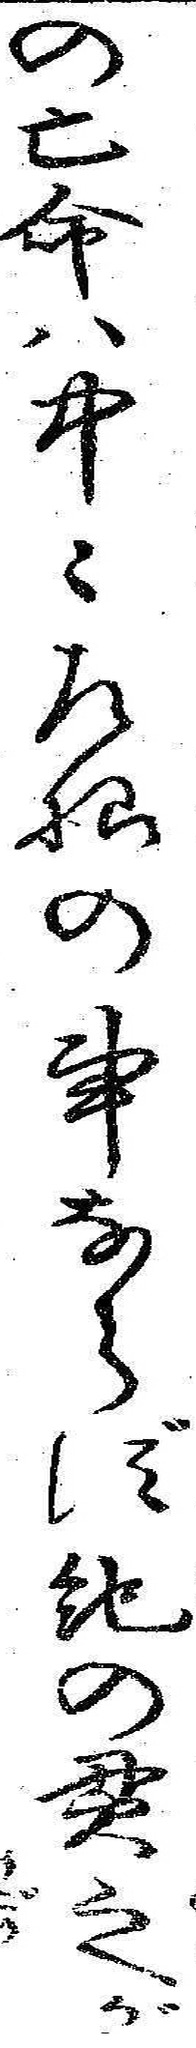の亡命は中々左様の事ならず紀の貫之が
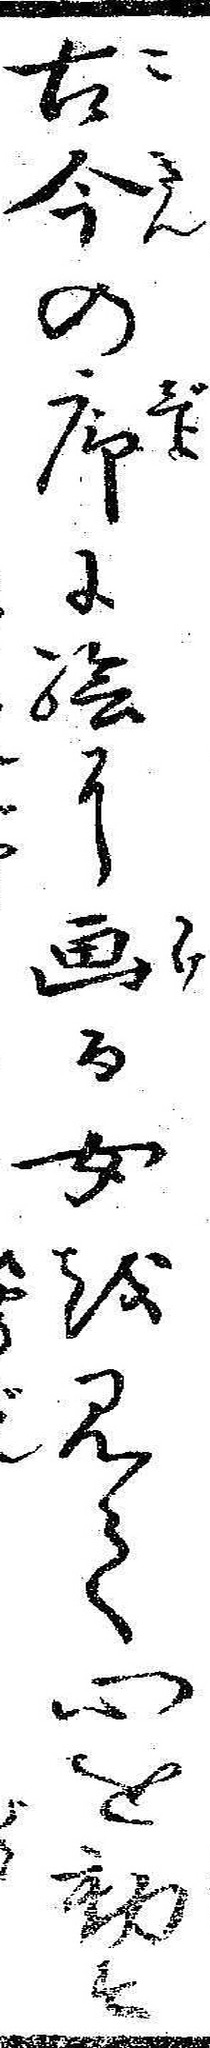古今の序に絵に画る女を見て心を動す
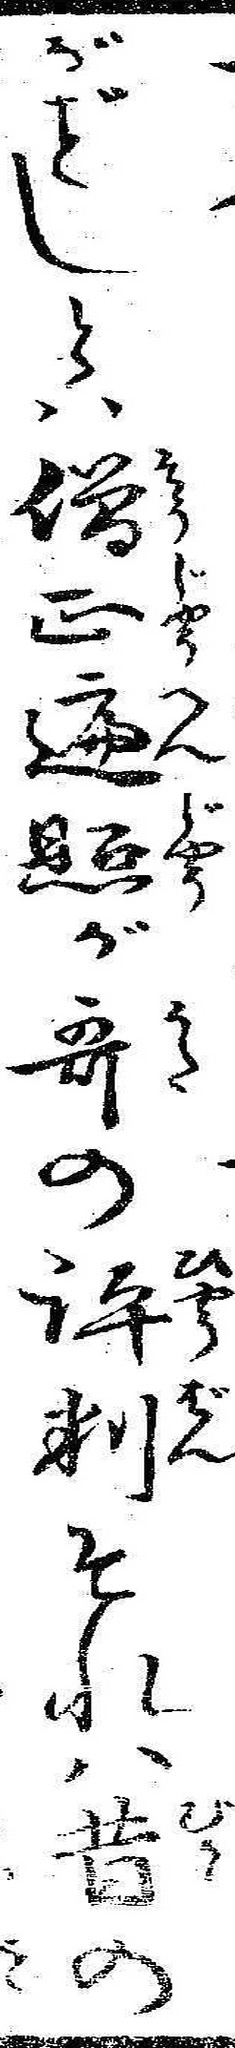がごとしとは僧正遍照が歌の評判それは昔の
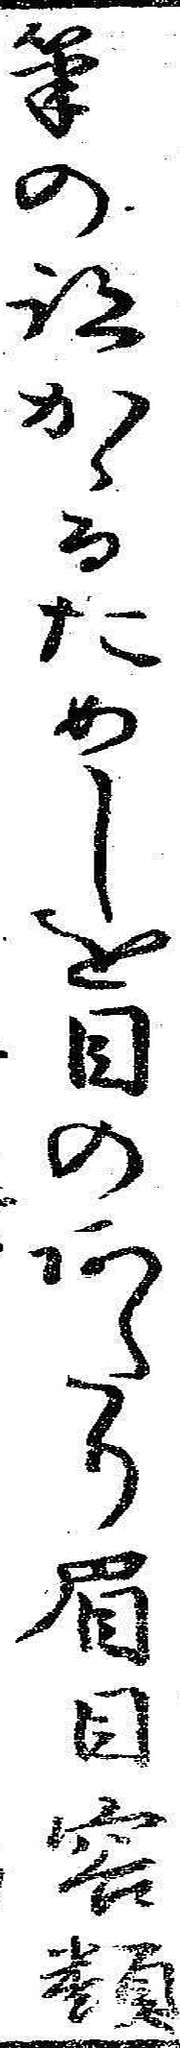筆の跡かゝるためしを目のあたり眉目容類
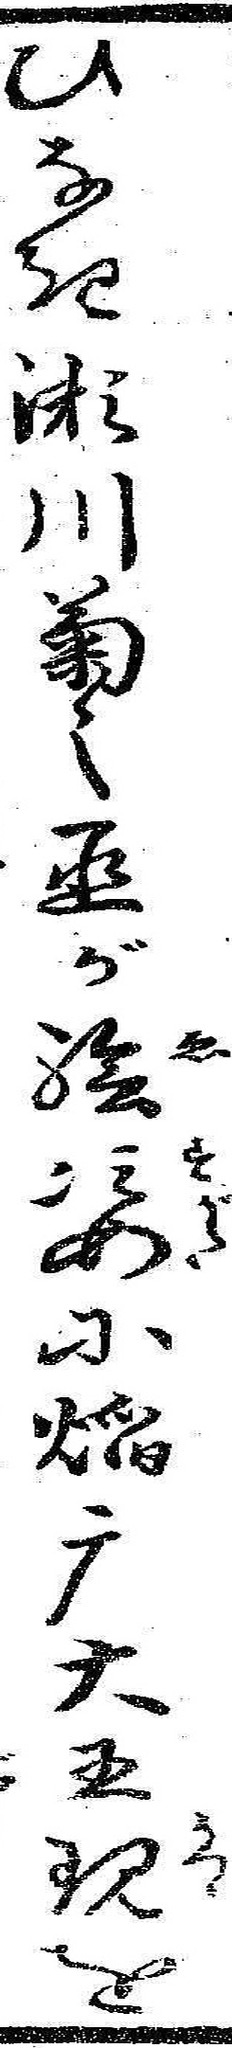ひなき瀬川菊之丞が絵姿に焔魔大王現を
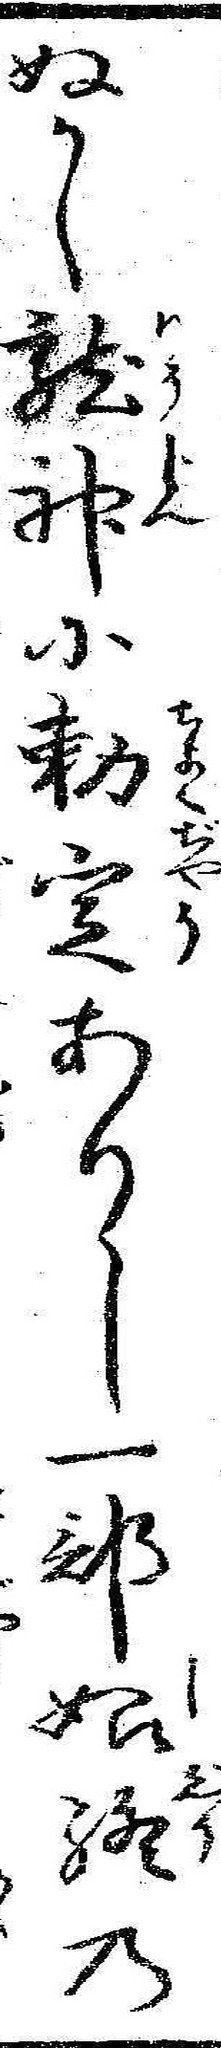ぬかし竜神に勅定ありし一部娘終の
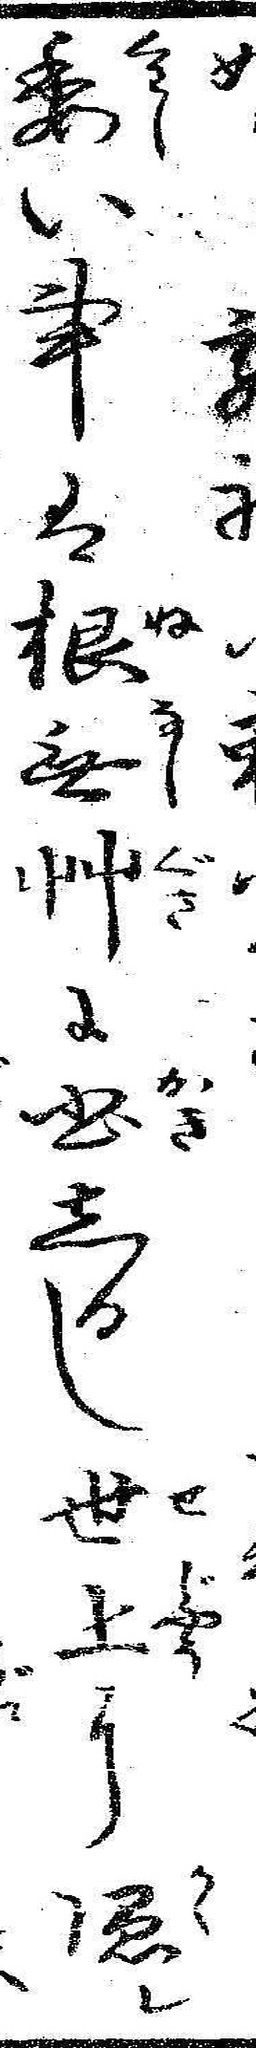委い事は根無艸に書しるし世上に隠
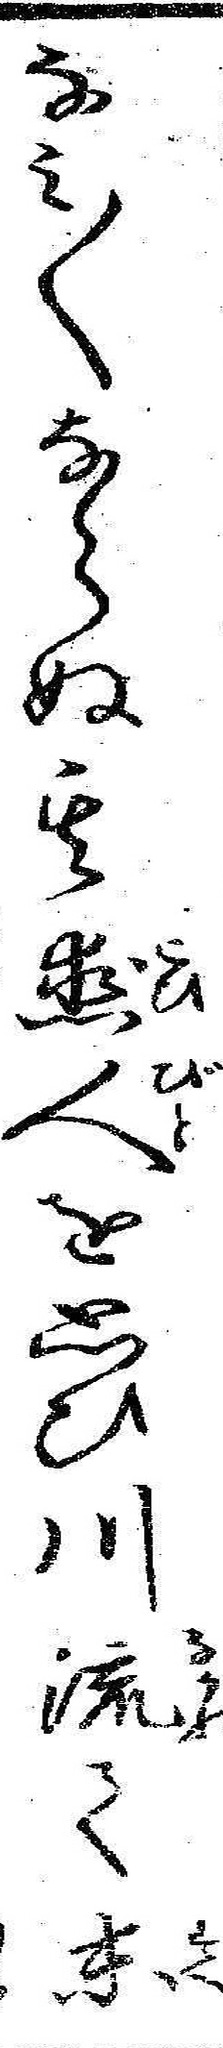なみ〱ならぬ其恋人を思ひ川流て末
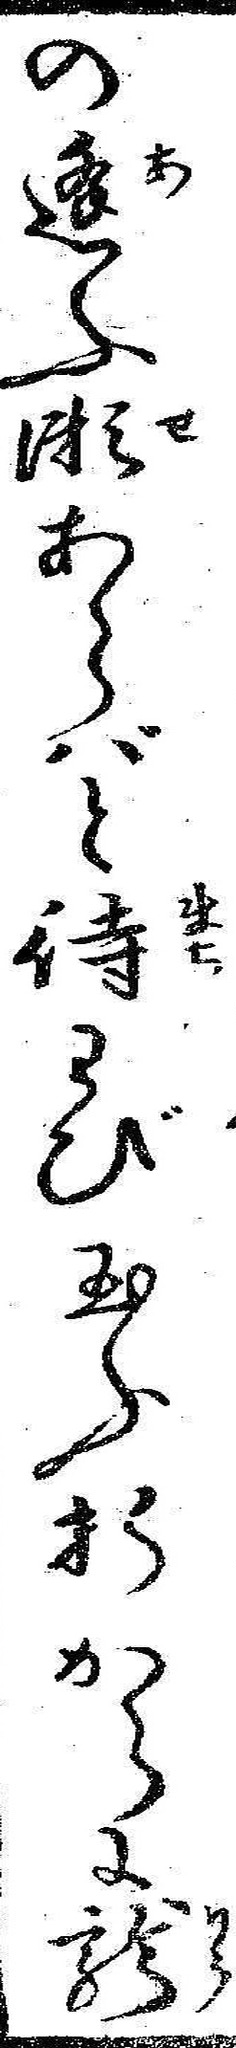の逢ふ瀬あらばと待わび玉ふ折からに龍

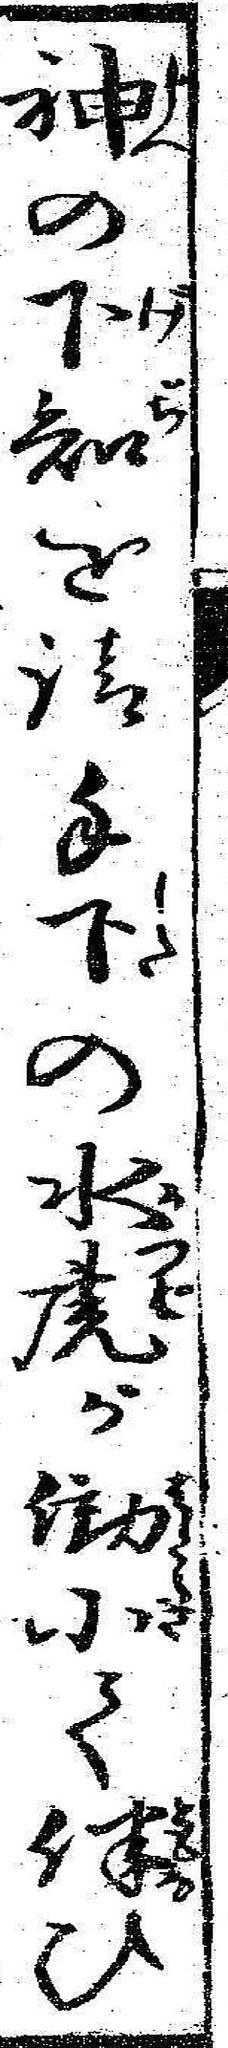神の下知を請手下の水虎が働にて伴ひ
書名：根無草後編
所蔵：国文学研究資料館
